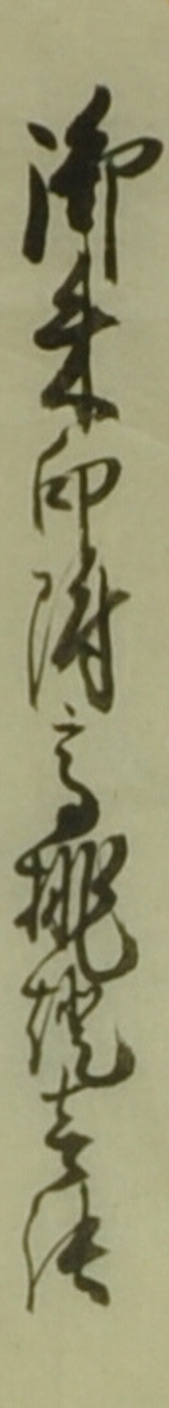御朱印附高挑燈壱張

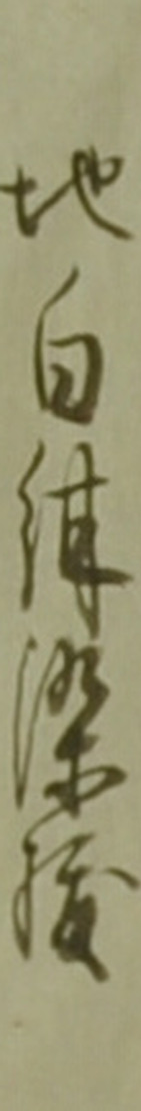地白紺染抜
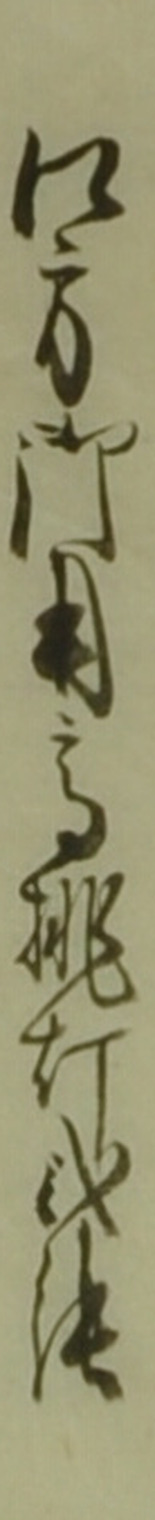郷方御用高挑灯弐張
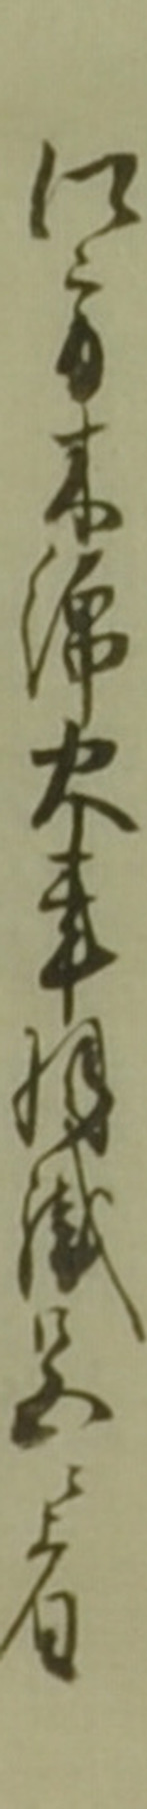郷方木綿火事羽織色二者
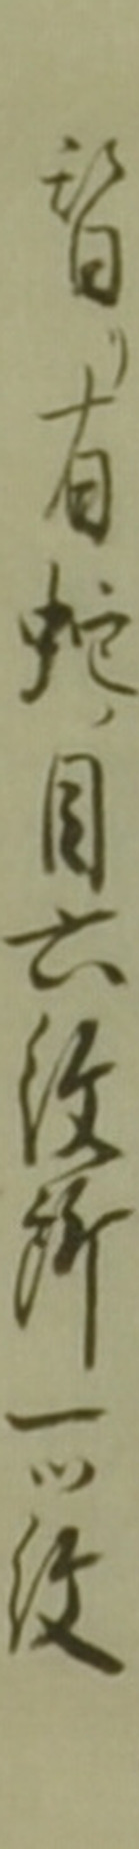替り有蛇ノ目六紋所一ツ紋
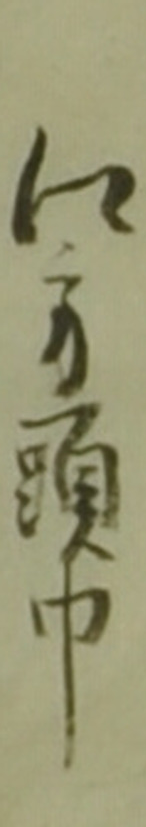郷方頭巾
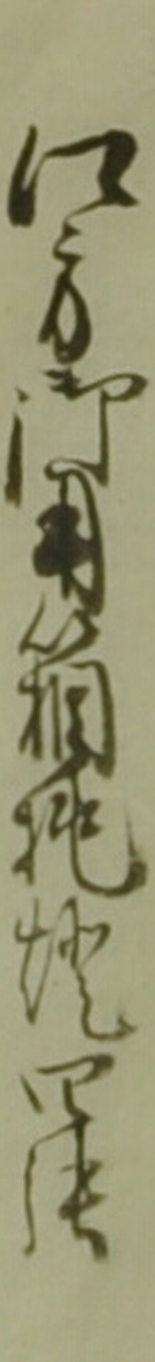郷方御用箱挑燈四張

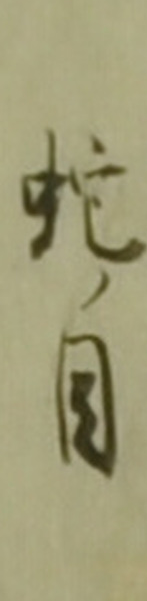蛇ノ目

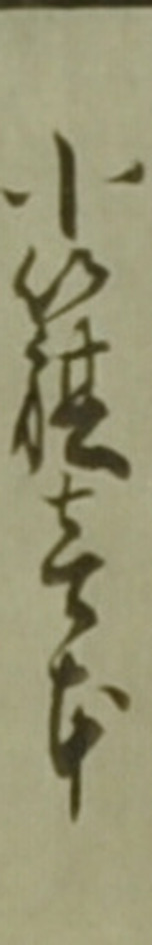小籏壱本
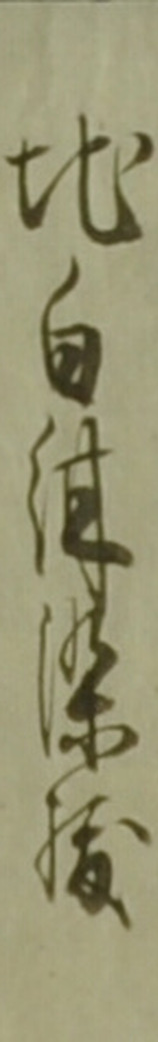地白紺染抜
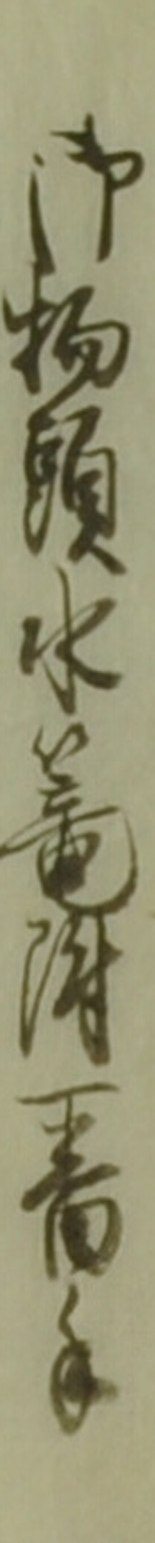(絵旗)御物頭水篭附一番手
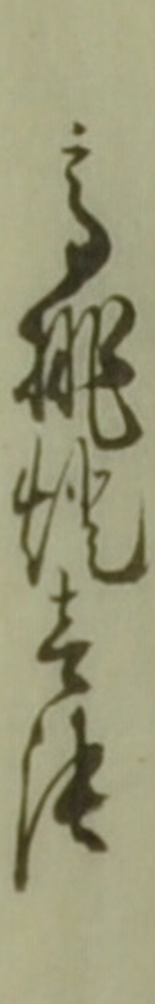高挑燈壱張
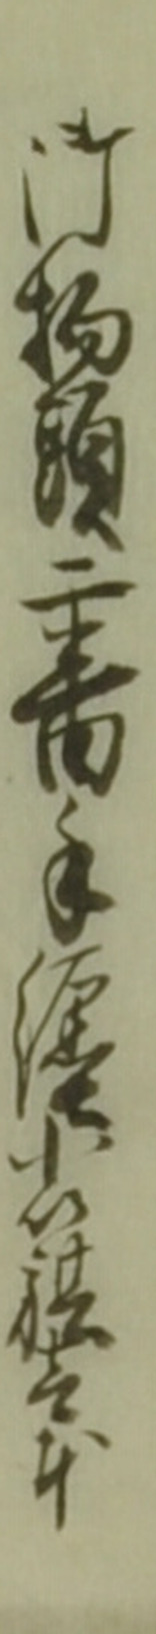(絵旗)御物頭二番手纏小籏壱本
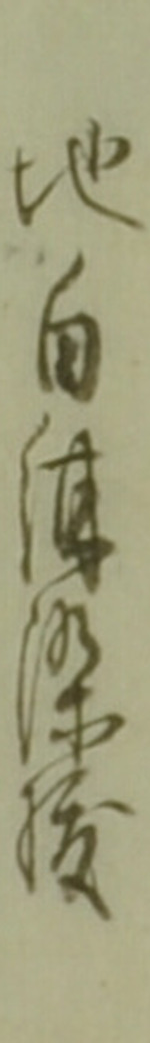地白紺染抜

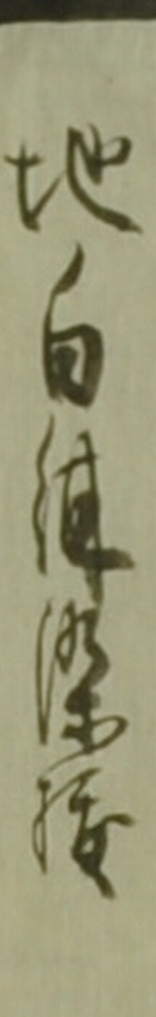地白紺染抜

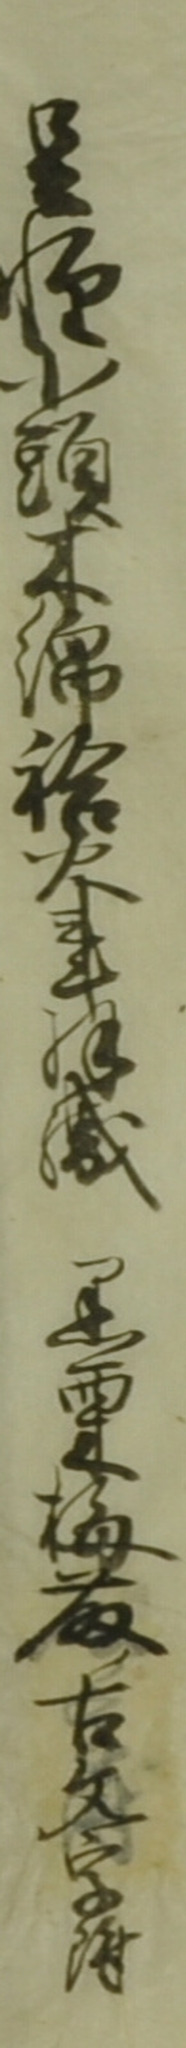足軽小頭木綿袷火事羽織黒栗梅藤ノ古文字附
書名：諸向御相印定法帳
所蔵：伊那市立高遠町図書館・合同会社AMANE
